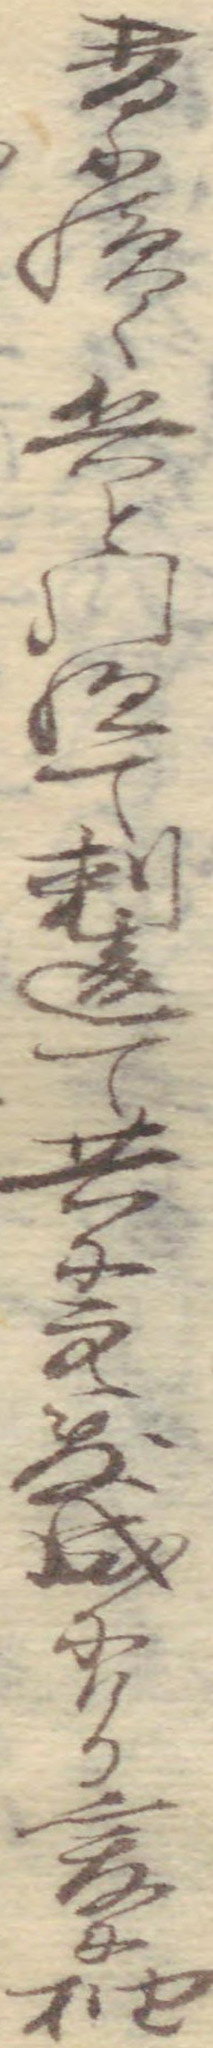番に続く兵と引組て刺違て共に空敷成にけり爰に柚
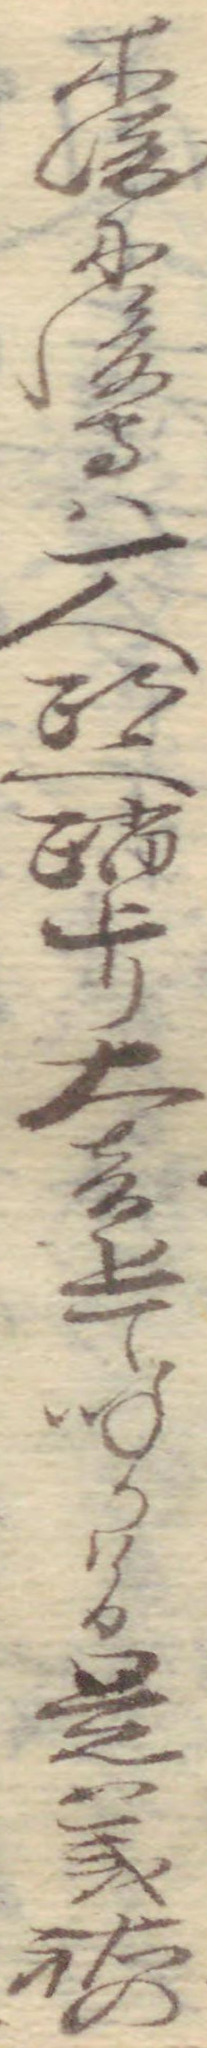木崎丹後守は一人跡へ踏止り大音上て呼りける是は義祐の
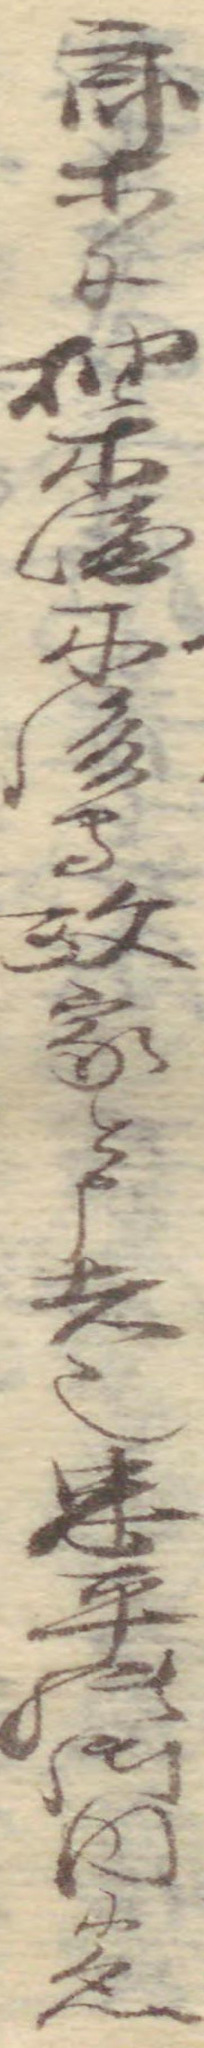郎等に柚木崎丹後守政家と申者也忠平の御内に名
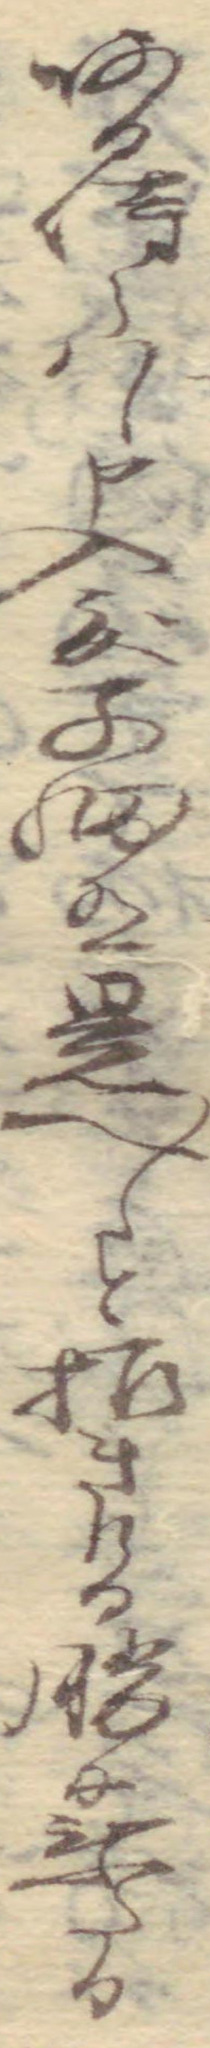ある侍しはし申入度子細有是へ〳〵と招きける勝に乗る
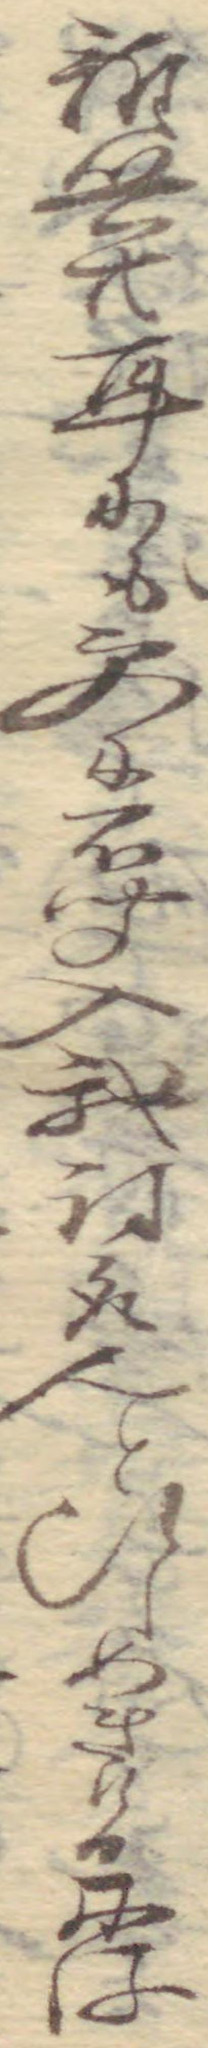雑兵共耳にも更に不聞入我討取んとひしめきける丹後
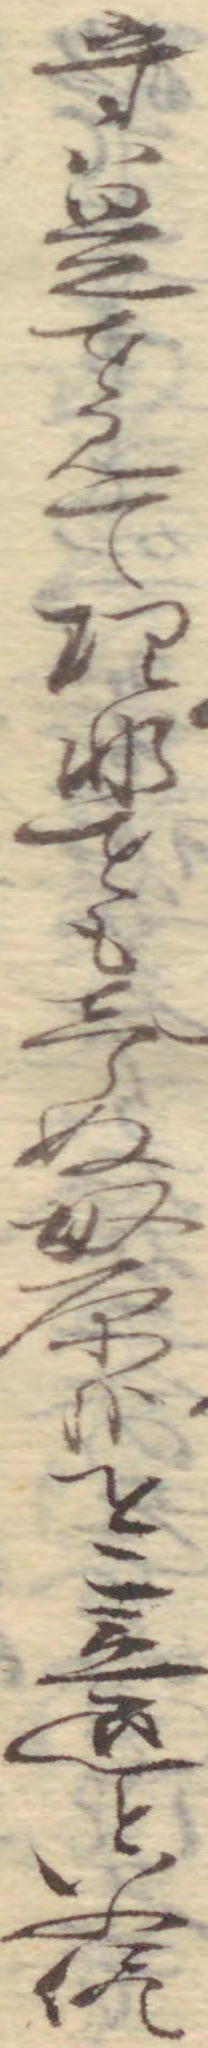守は是を見て理非をもしらぬ奴原哉そこ立退という儘
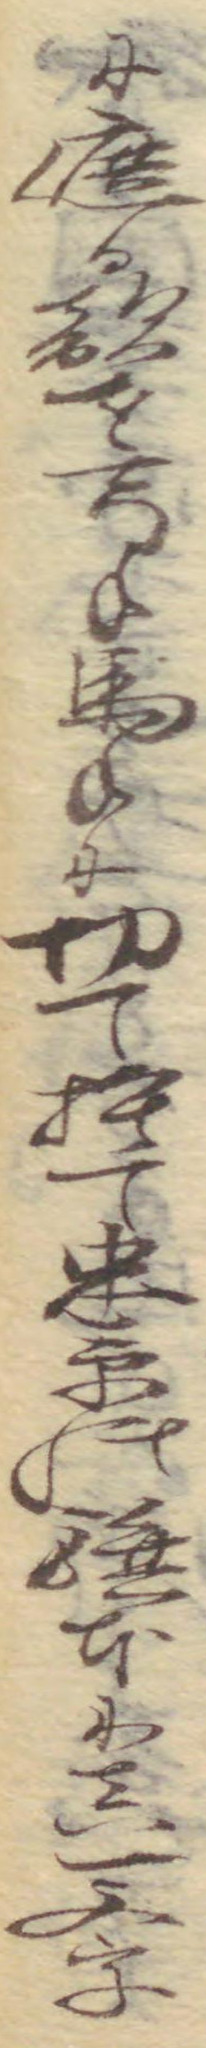に遮る敵を弓手馬手に切て捨て忠平の旗本に真一文字
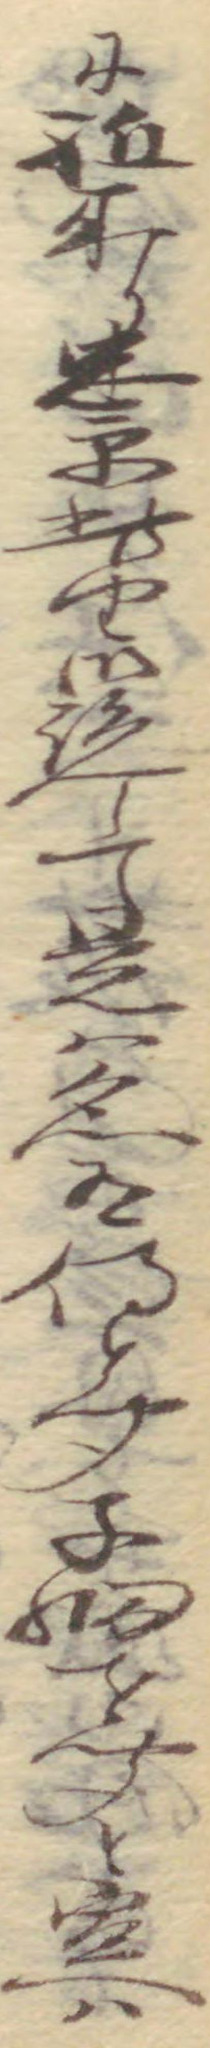に駈来り忠平其由御覧して是は名有侍と聞子細を聞と宣へは
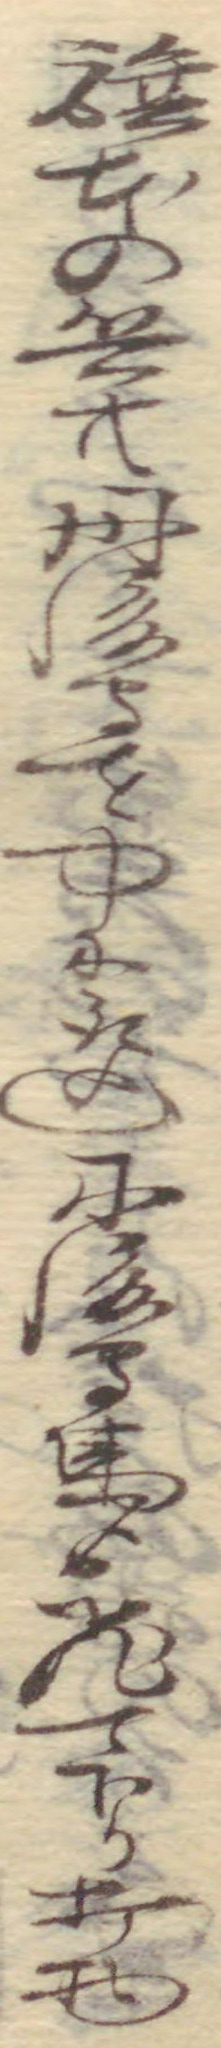旗本の兵共丹後守を中に取込丹後守馬ゟ飛て下り打物
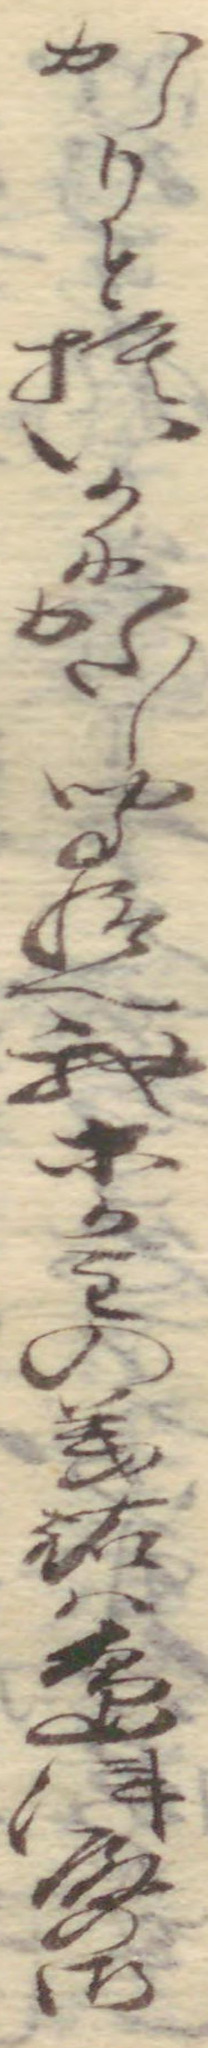からりと捨いかにかた〳〵聞給へ我等か主の義祐は嶋津殿の御
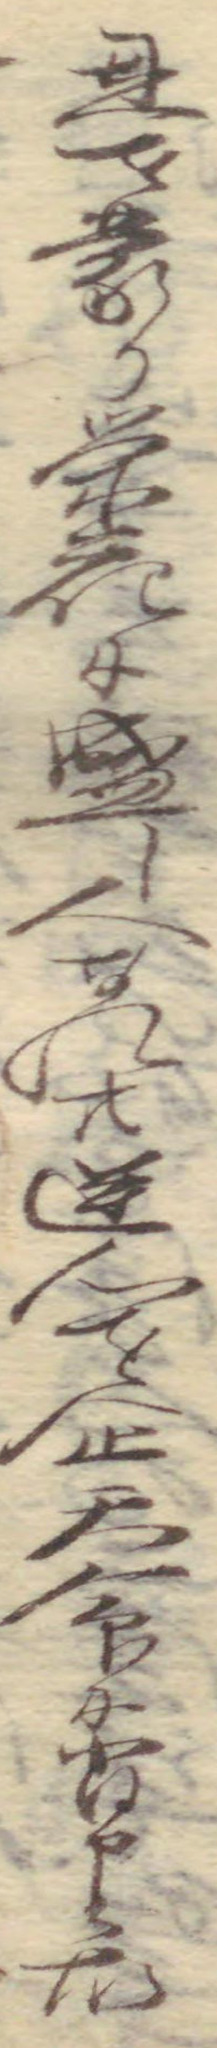恩を蒙り栄花に盛し人なれ共逆心を企天命に背申候故
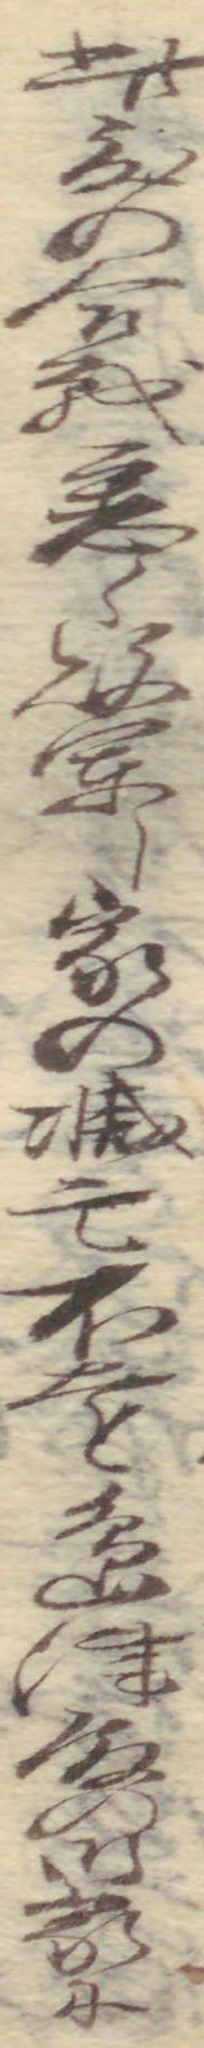此度の合戦悉く敗軍し家の滅亡不遠嶋津殿の御家に
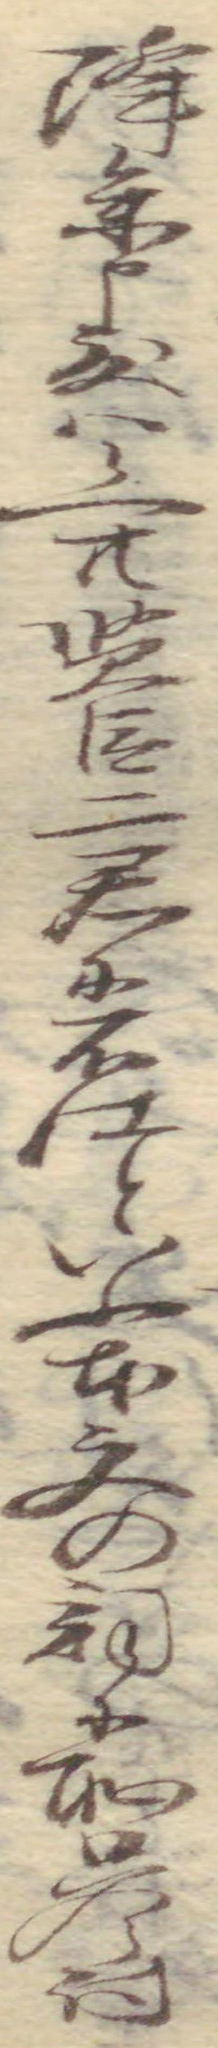降参申度は候へ共賢臣二君に不仕といふ本文の詞に恥只今討
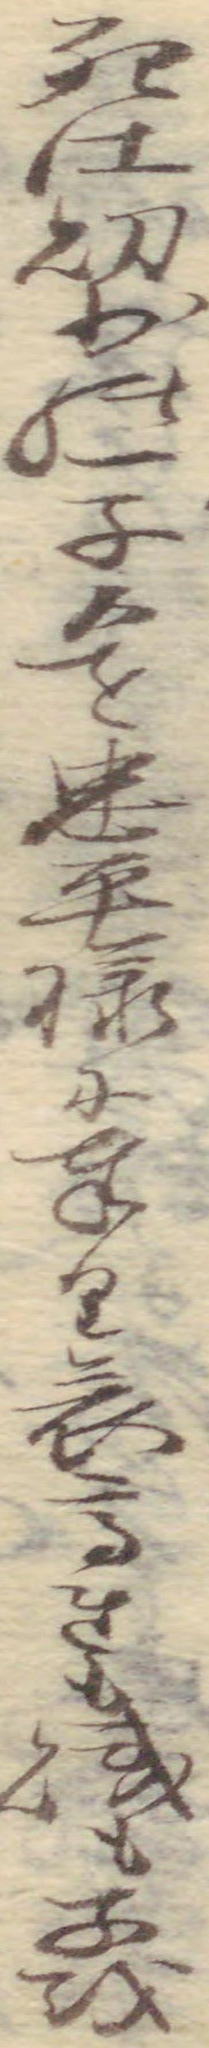死仕幼少の一子候を忠平様に奉り哀高きも賤も子を
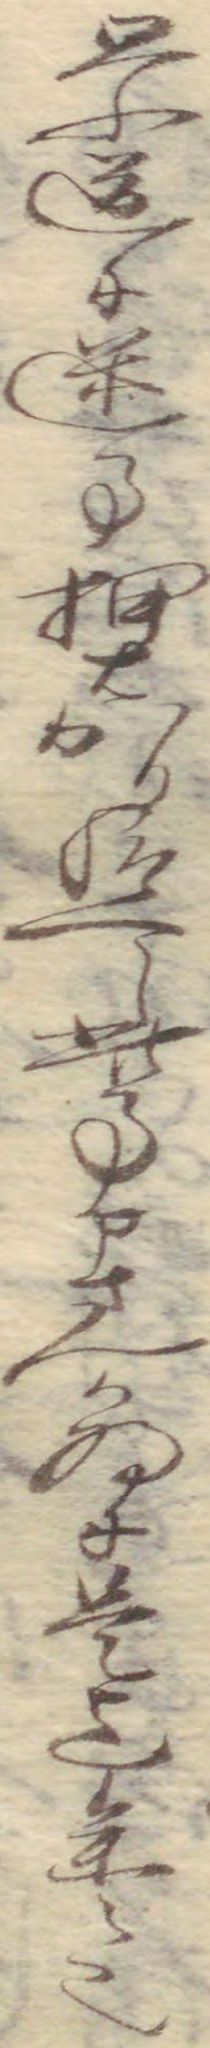思ふ道に迷事押はかり給へし此事申さんか為に是迄参候也
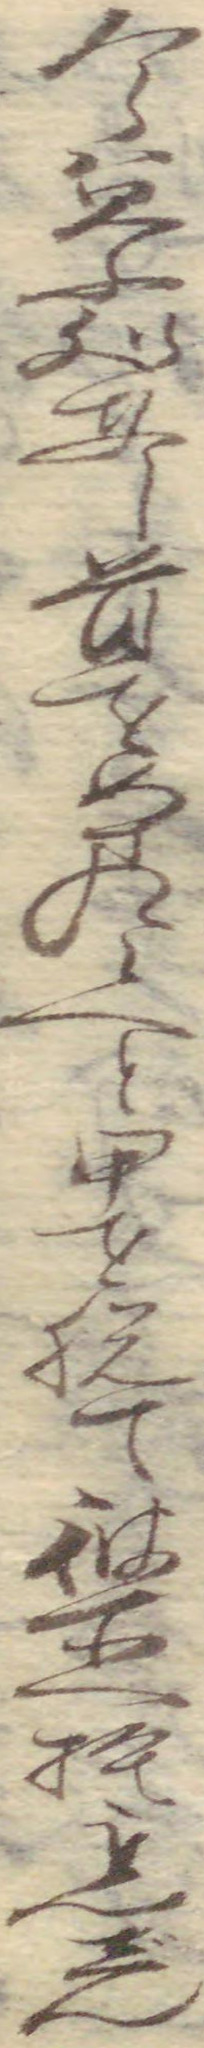今は思ふ処なし首をめされ候へと甲を脱て彼所へ捨もんじん
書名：鶯宿雑記. 巻199-200
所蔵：国立国会図書館 National Diet Library, JAPAN
